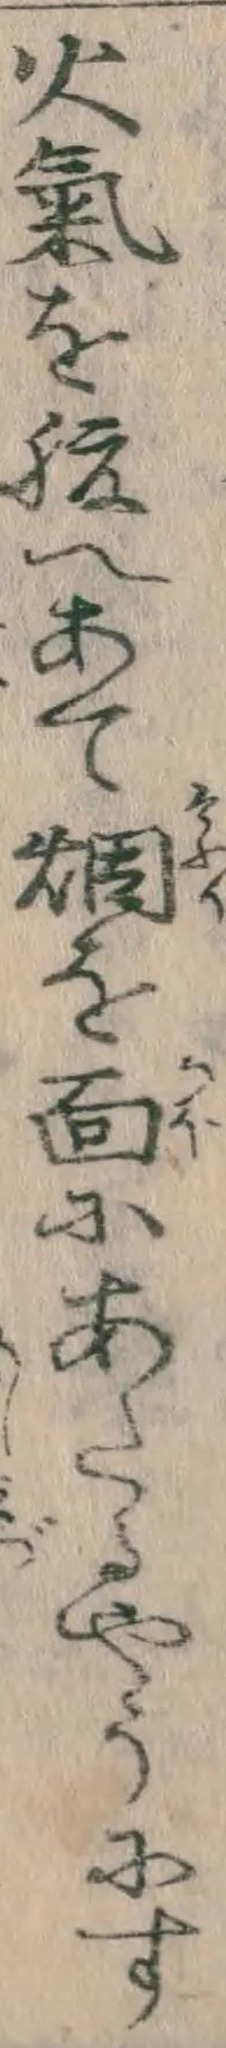火気を腹へあて烟を面にあたるやうにす
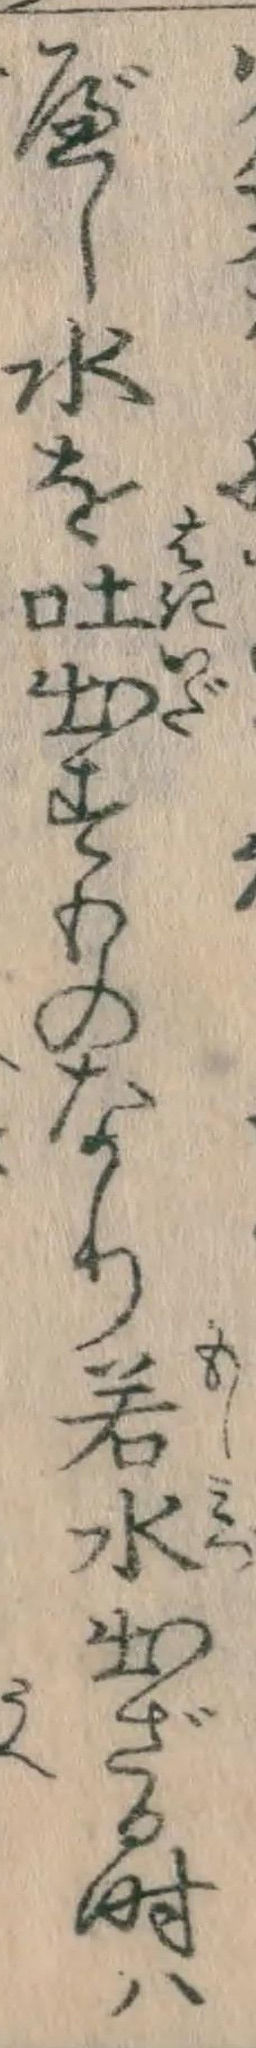べし水を吐出すものなり若水出ざる時は
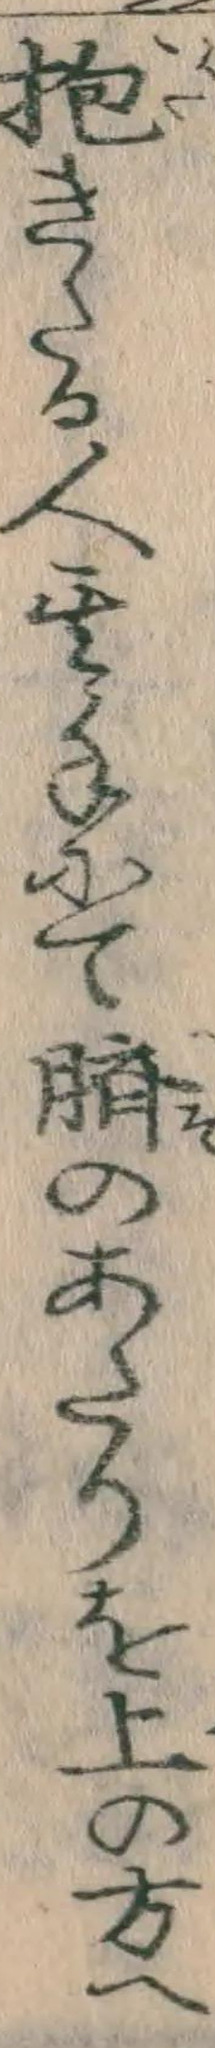抱きたる人其手にて臍のあたりを上の方へ
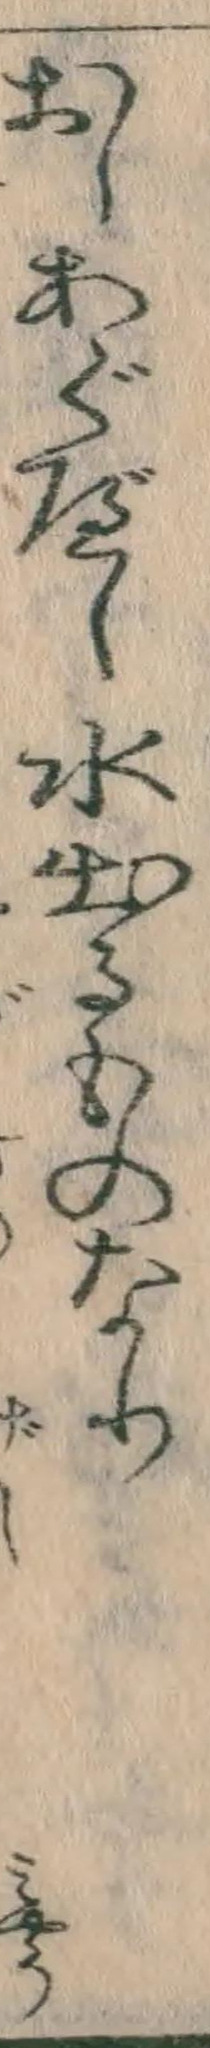おしあぐべし水出るものなり
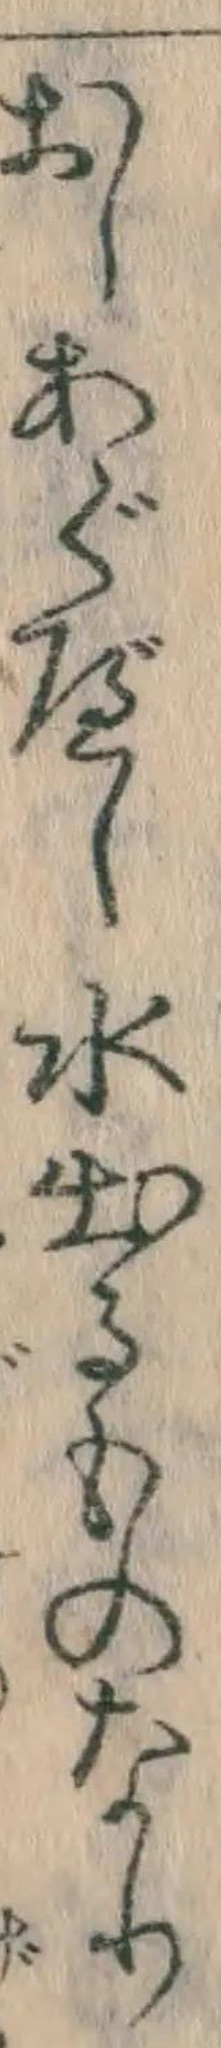おしあぐべし水出るものなり
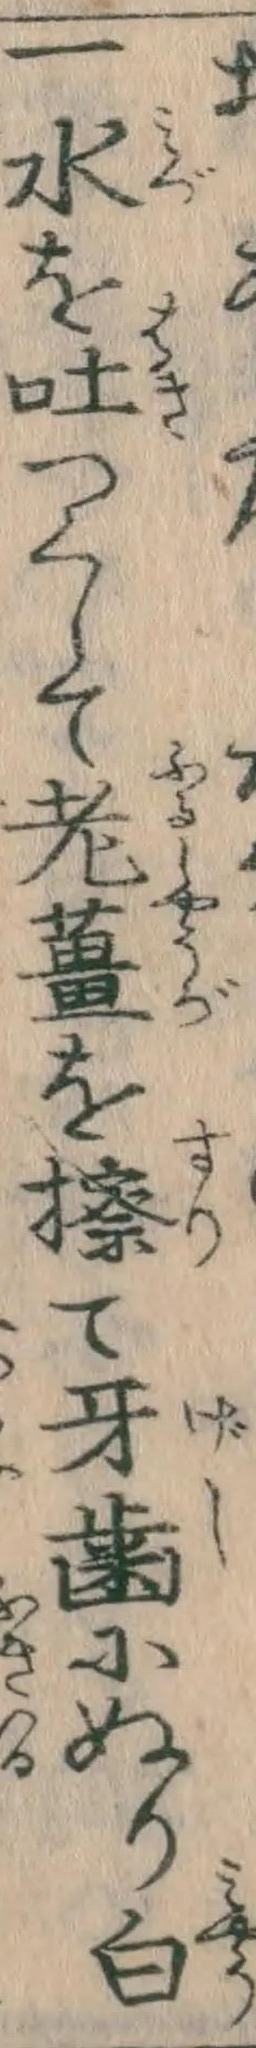一水を吐つくして老薑を擦て牙歯にぬり白
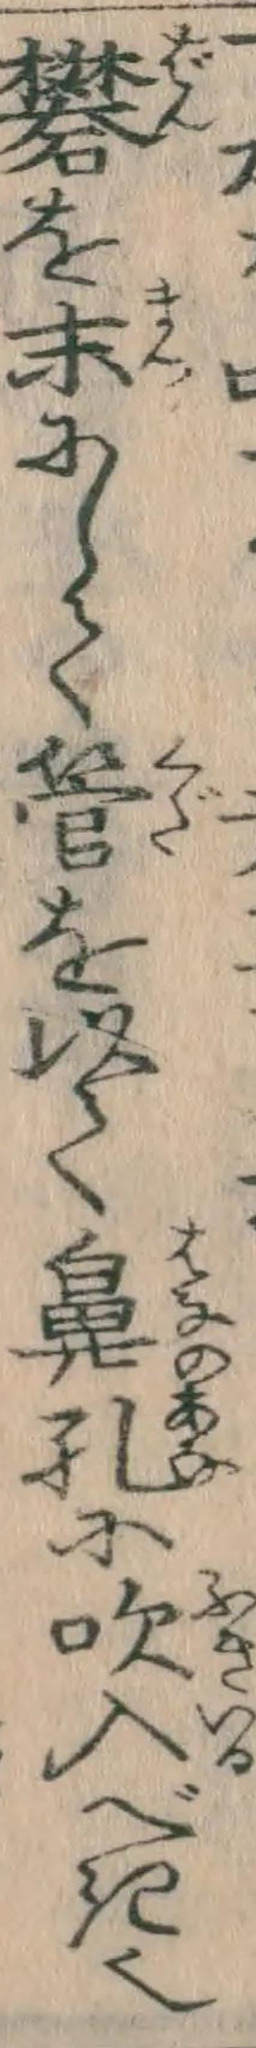礬を末にして管を以て鼻孔に吹入べき也
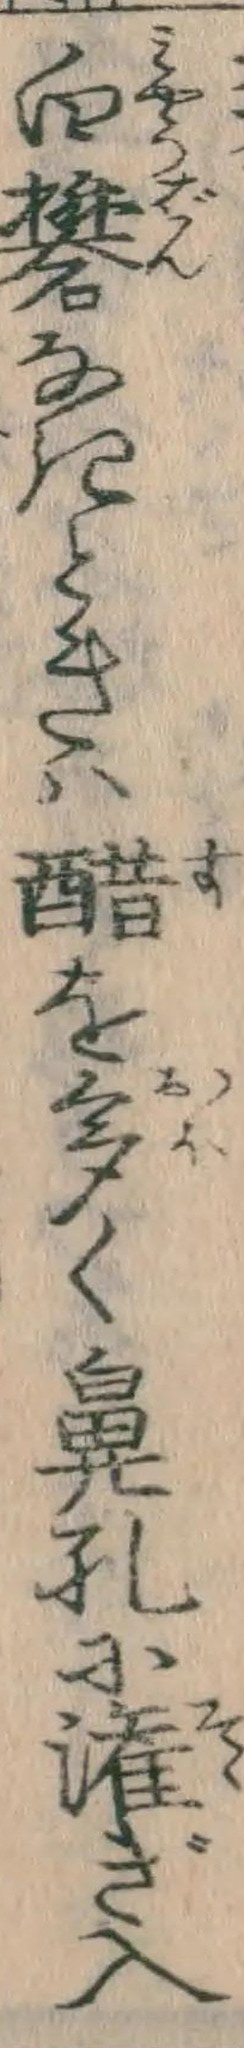白礬なきときは醋を多く鼻孔に濯ぎ入
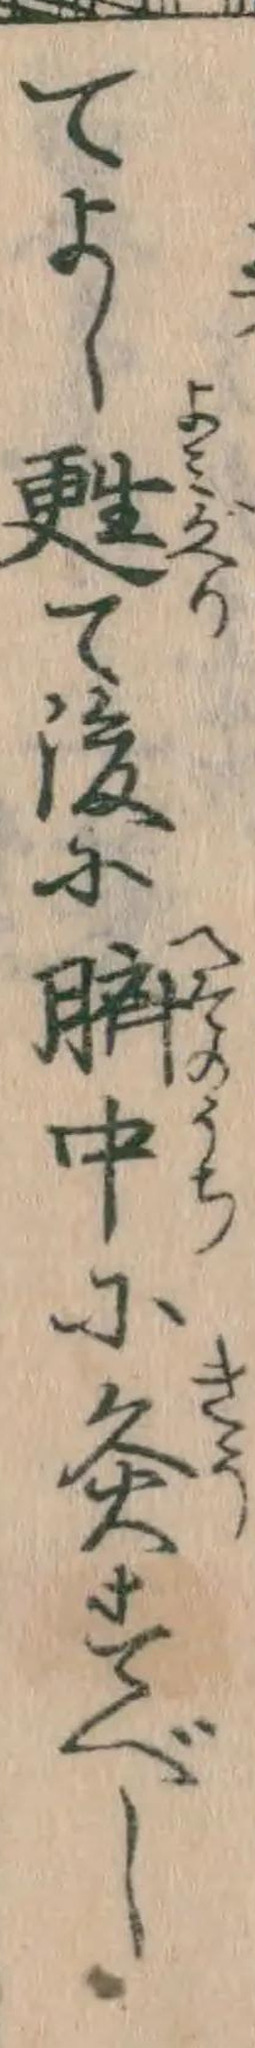てよし甦て後に臍中に灸すべし
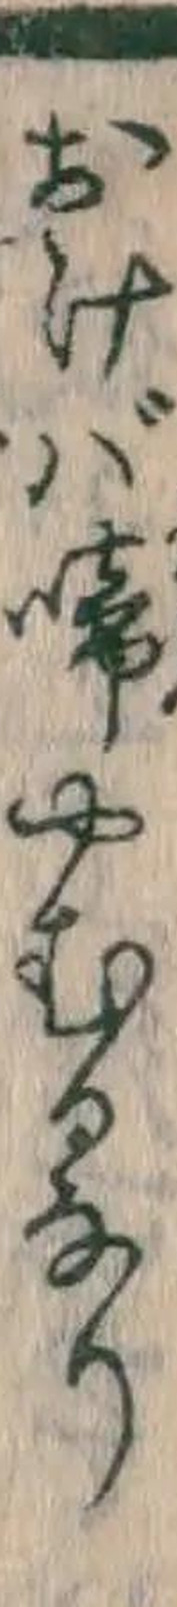おけば啼やむるなり
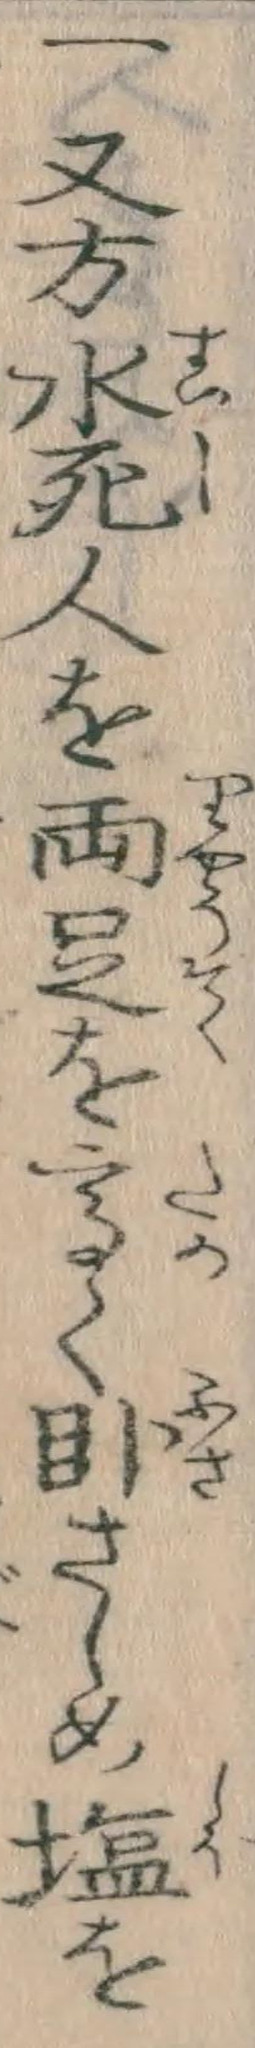一又方水死人を両足を高く臥さしめ塩を
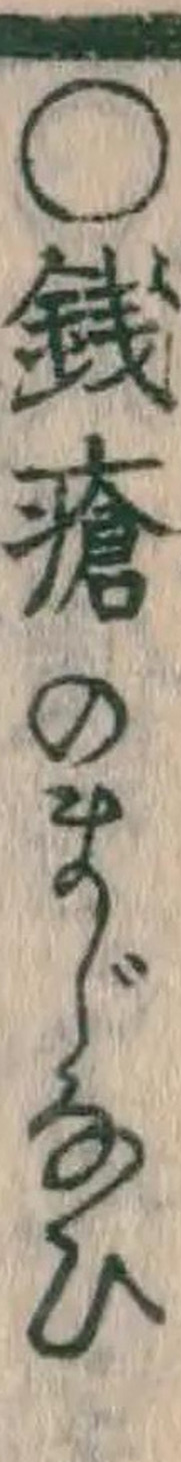○銭瘡のまじなひ
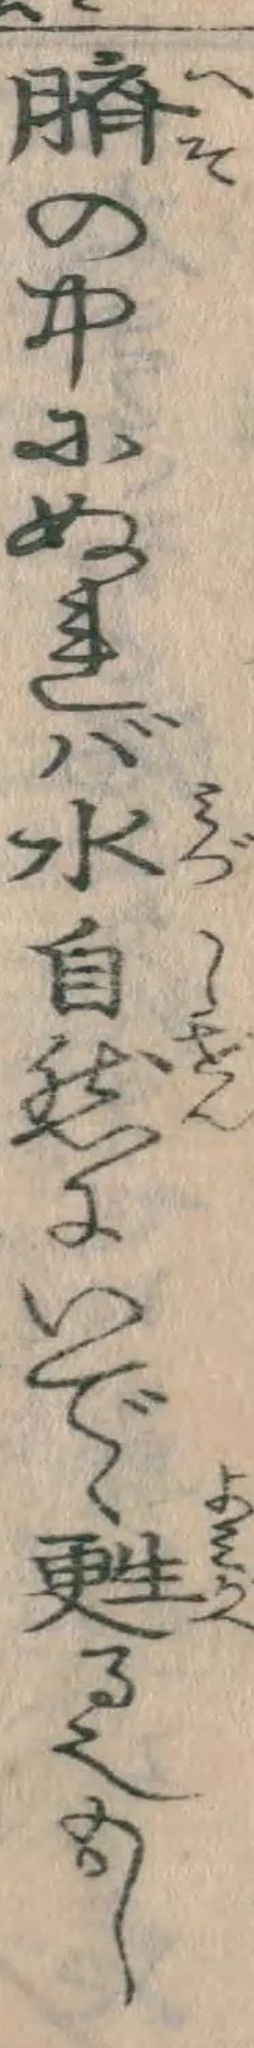臍の中にぬれば水自然にいでゝ甦る也もし
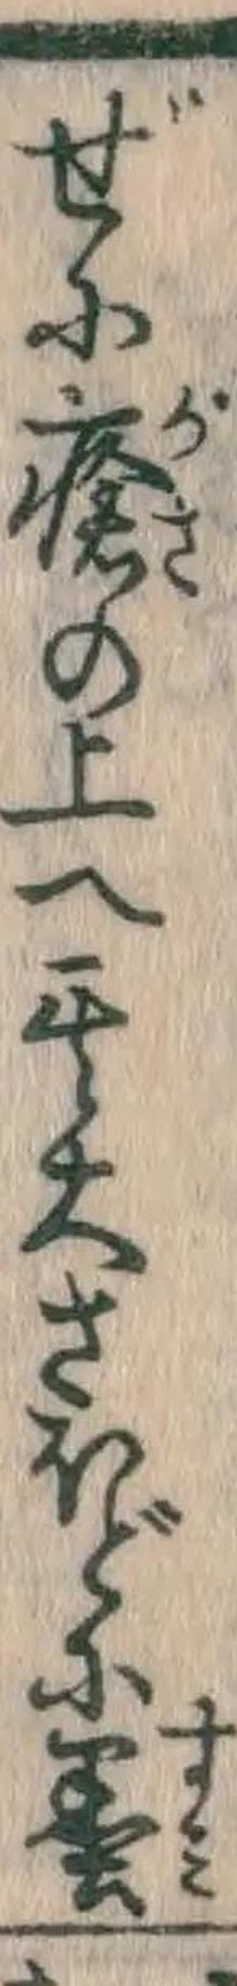ぜに瘡の上へ其大さほどに墨
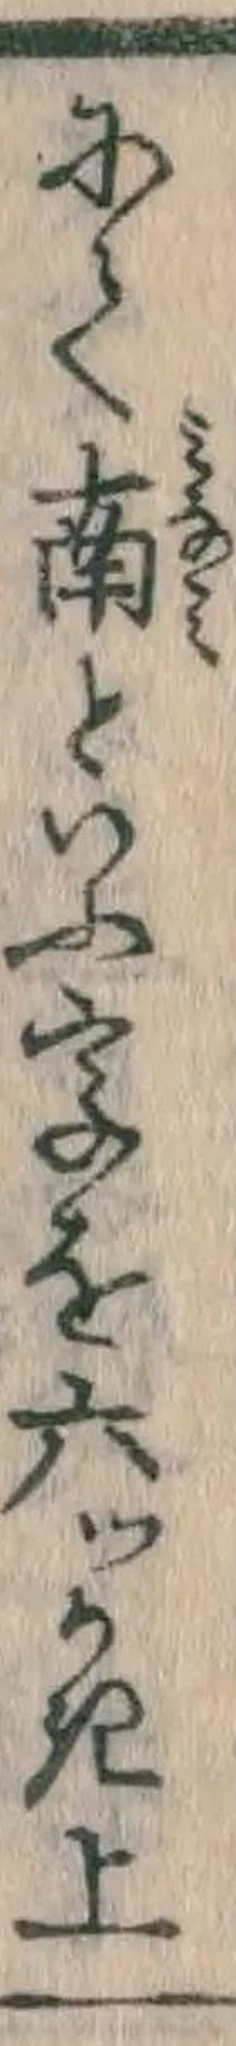にて南といふ字を六ッかき上
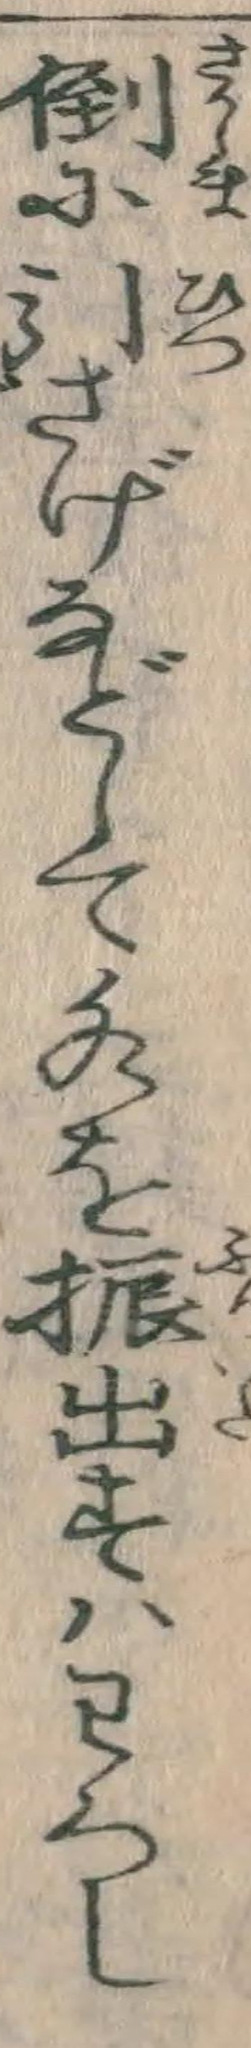倒に引さげなどして水を振出すはわろし
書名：広益秘事大全 3巻. [4]
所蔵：国立国会図書館 National Diet Library, JAPAN
